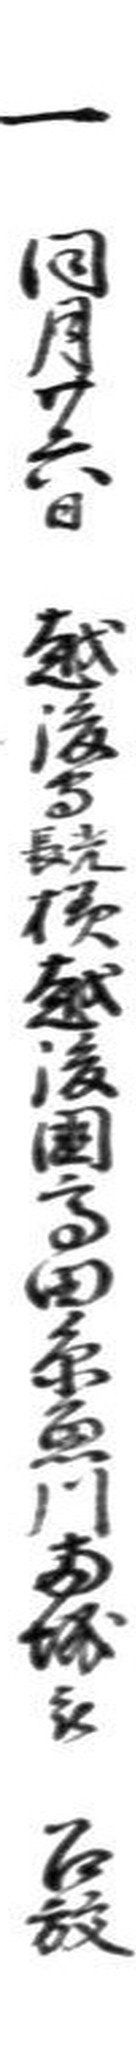一同月廿六日越後守光長様越後国高田糸魚川両城被召放
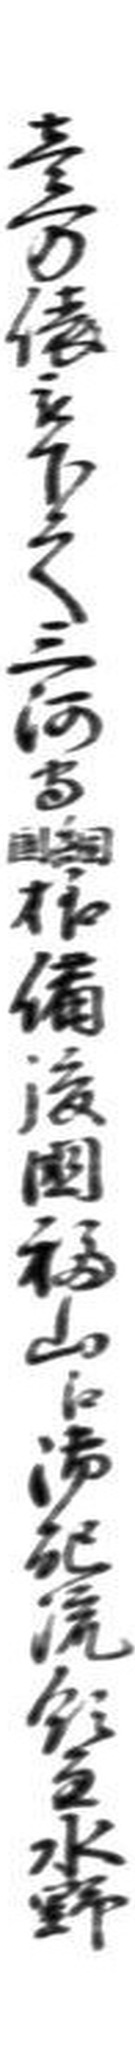壱万俵被下之三河守綱国様備後国福山江御配流領主水野
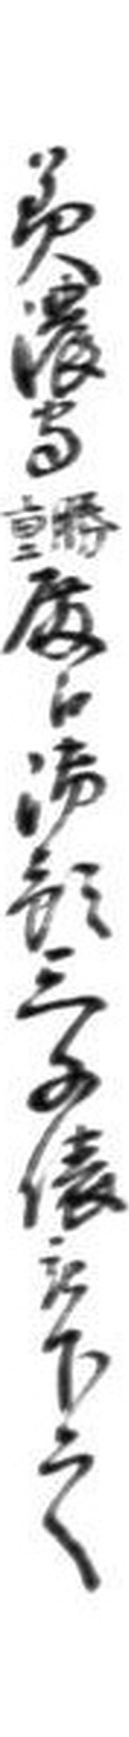美濃守勝重殿江御預三千俵被下之

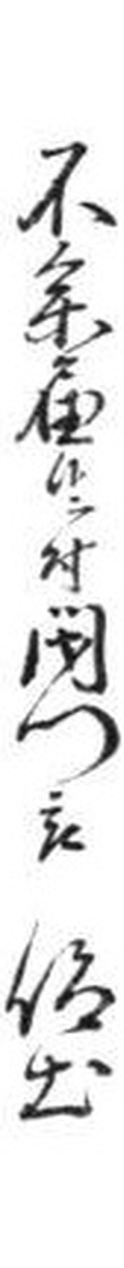不参届候ニ付閉門被仰出
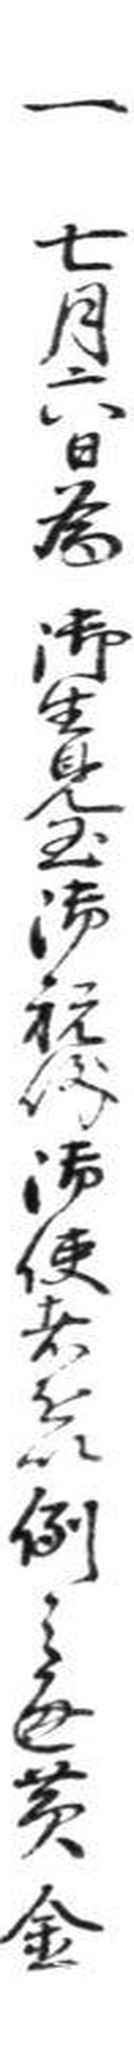一七月六日為御生見玉御祝儀御使者を以例之通黄金
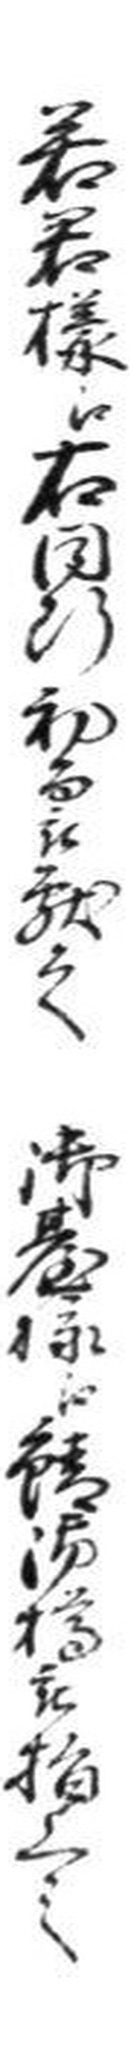若君様江右同断初而被献之御台様江鯖御樽被指上之
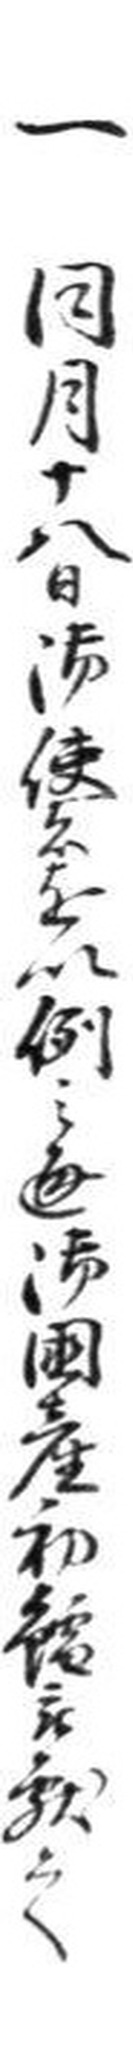一同月十八日御使者を以例之通御国産初鱈被献之
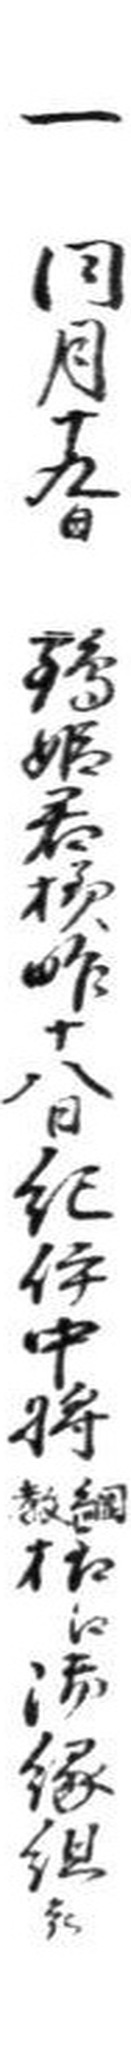一同月十九日鶴姫様昨十八日紀伊中将綱教様江御縁組被
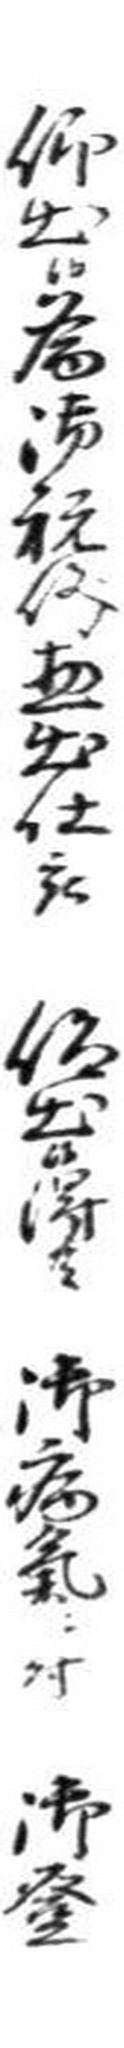仰出候為御祝儀惣出仕被仰出候得共御病気ニ付御登
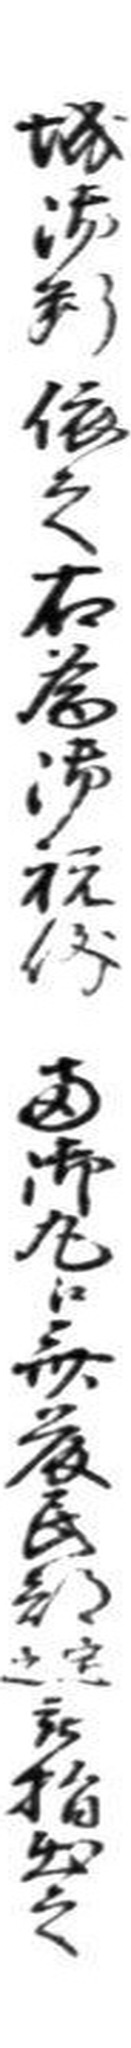城御断依之右為御祝儀両御丸江斎藤民部定之被指出之
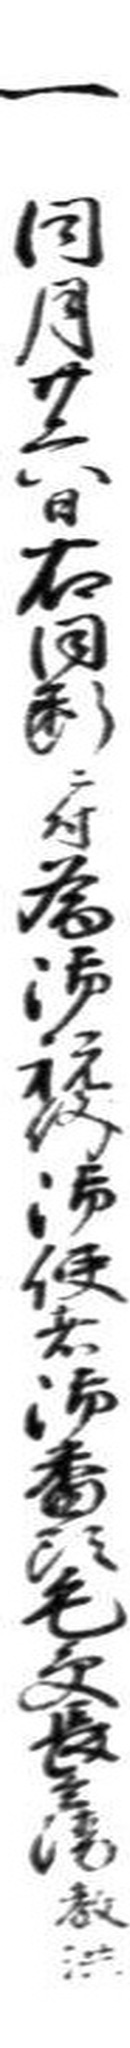一同月廿六日右同断ニ付為御祝儀御使者御番頭毛受長兵衛教洪
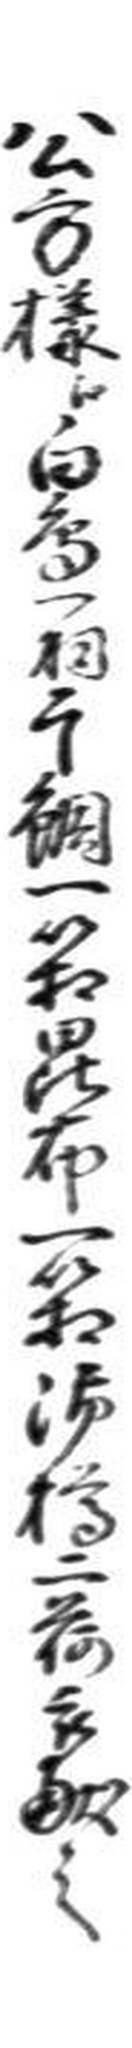公方様江白鳥一羽干鯛一箱昆布一箱御樽二荷被献之
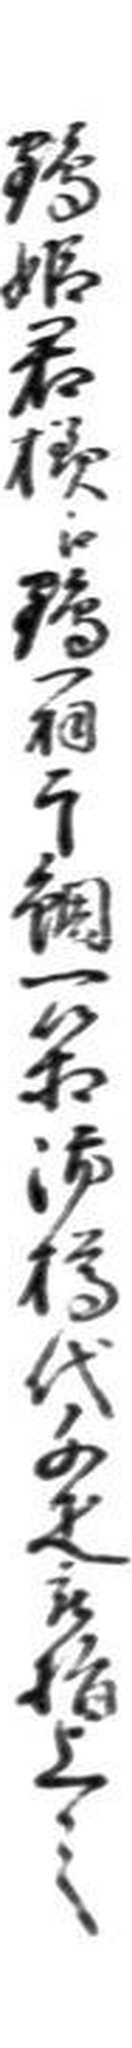鶴姫君様江鶴一羽干鯛一箱御樽代千疋被指上之
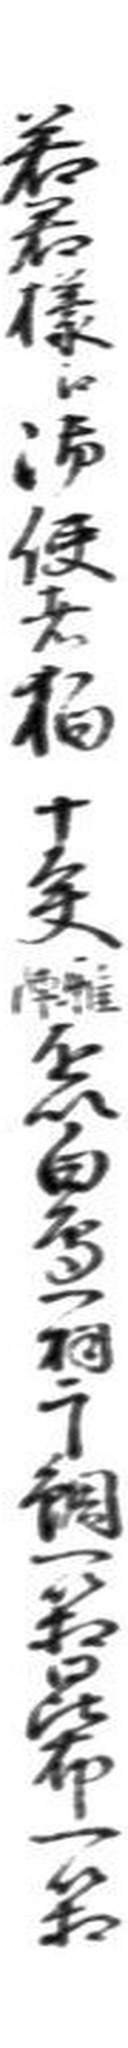若君様江御使者狛十大夫雅際を以白鳥一羽干鯛一箱昆布一箱
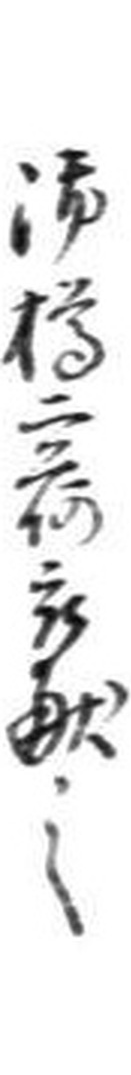御樽二荷被献之
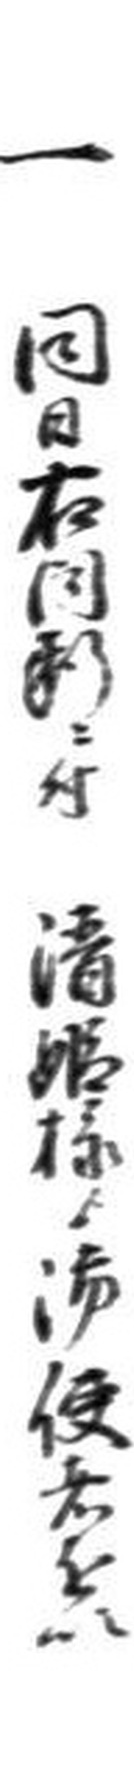一同日右同断ニ付清姫様ゟ御使者を以
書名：家譜 十五 綱昌公 従天和元年到元禄十二年
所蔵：福井県文書館 Fukui Prefectural Archives
